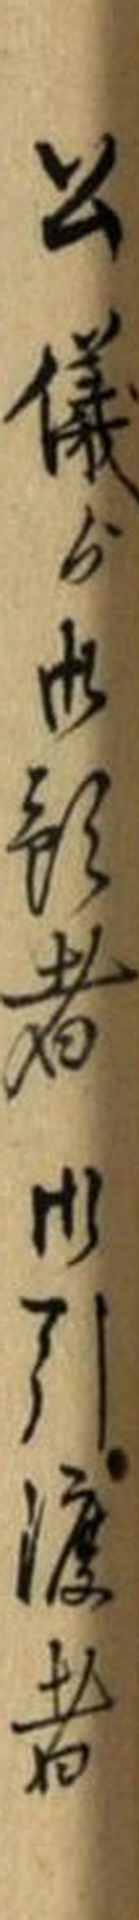公儀ゟ御預者御引渡者
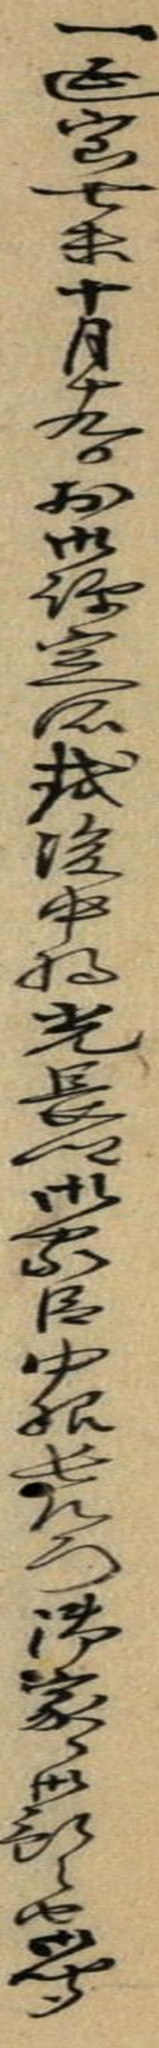一延宝七未十月十九日於御評定所越後中将光長卿御家臣中根長左衛門御家へ御預之由御聞
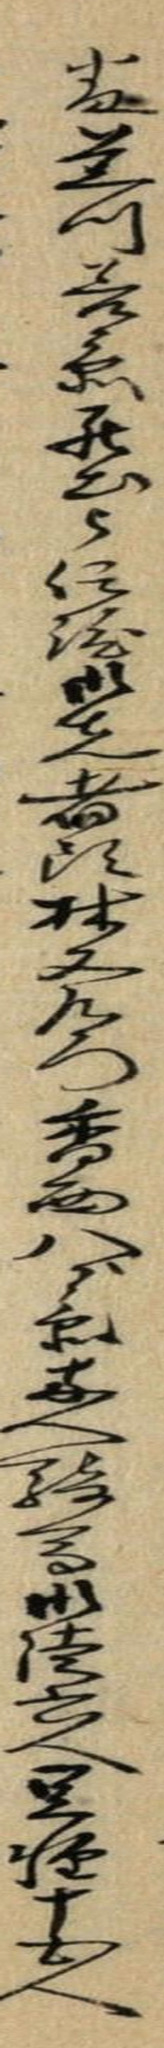番荒川善兵衛罷出被仰渡御先者頭林久左衛門香西八郎兵衛両人騎馬御徒六人足軽十五人
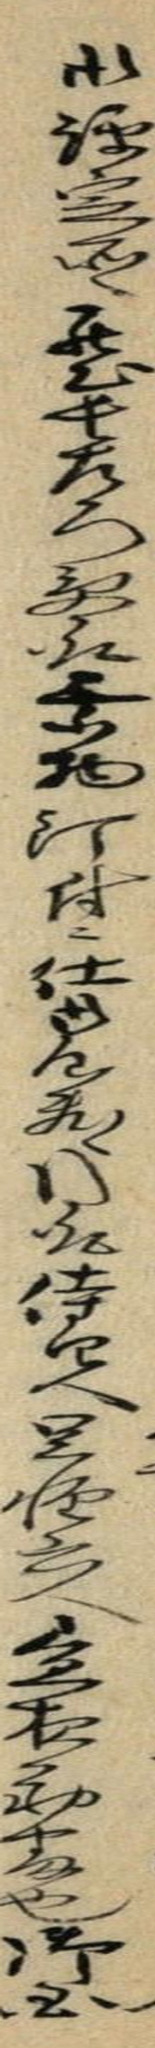御評定所へ罷出長左衛門受取乗物釘打に仕御屋敷へ引取侍四人足軽六人昼夜勤番也御国
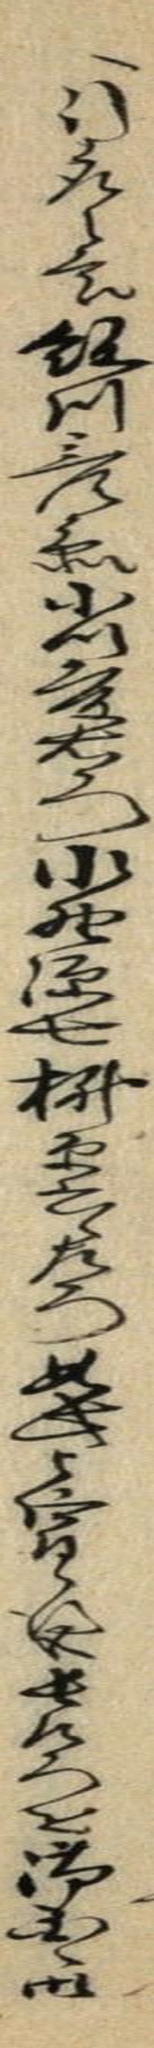へ引取之節飯川彦兵衛小川藤右衛門小野源七榊原六郎左衛門如此被仰付候得共長左衛門を御国へ御
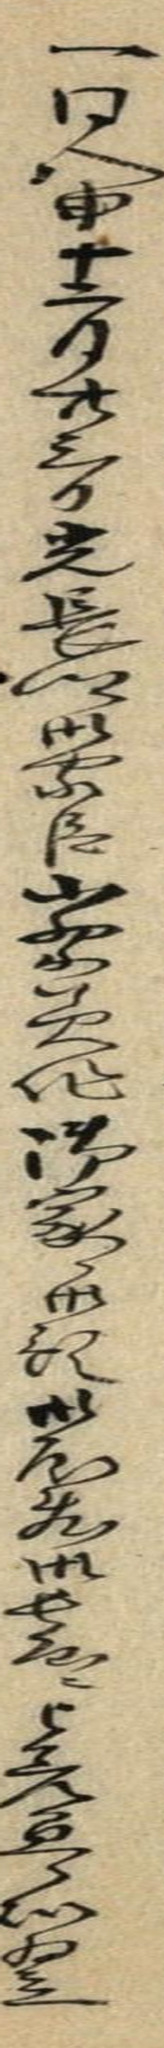一同八申十二月廿三日光長卿御家臣小栗美作御家へ御預御屋敷御長屋に被差置候処翌
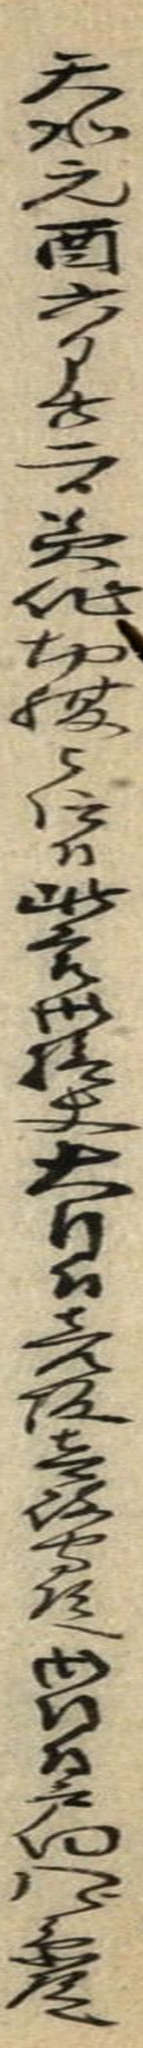天和元酉六月廿二日美作切腹被仰付此節御検使大目付彦坂壱岐守殿御目付戸田八郎兵衛殿
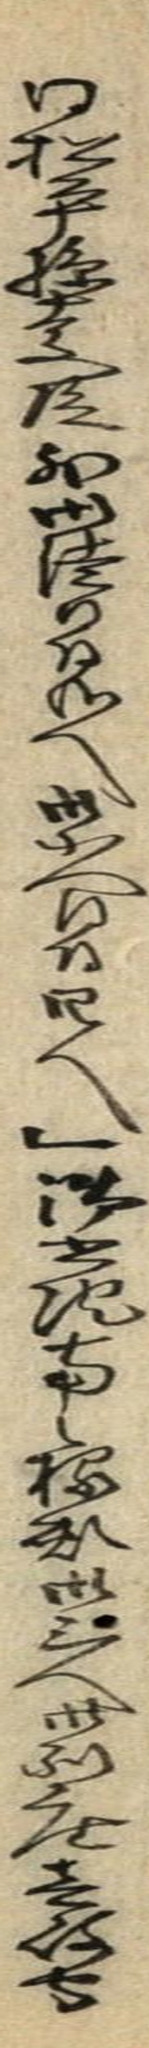同松平孫大夫殿外御徒目付弐人御小人目付四人」御書院南之縁頬御三人御列座壱岐守
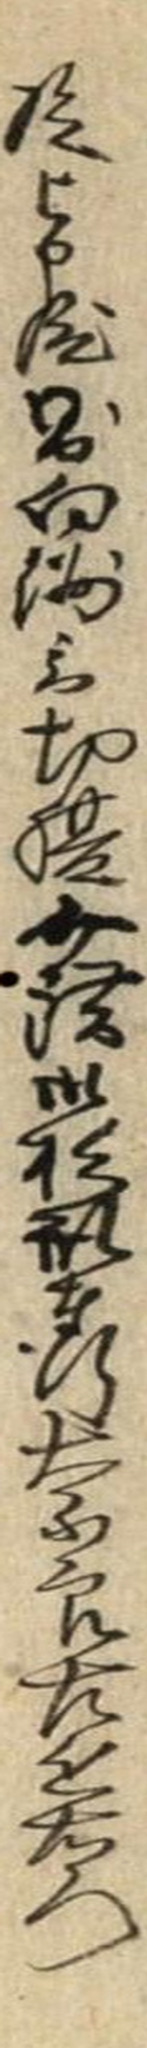殿被申渡則白洲にて切腹介錯御杉形奉行奈良左近右衛門
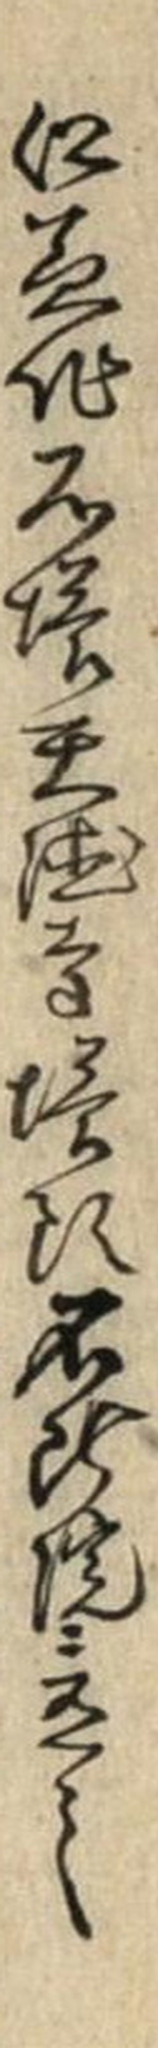但美作石塔天徳寺塔頭不断院に有之
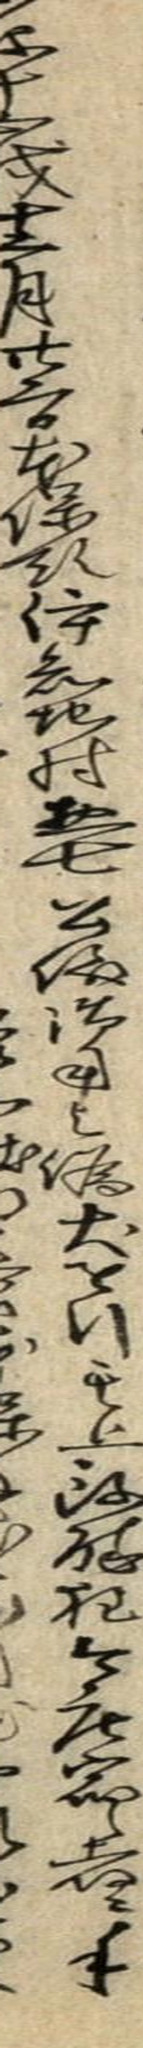一享保十五戌十二月廿二日本保領伊知地村惣七公儀御用と偽犬を引其上致酔狂今庄宿之者に手
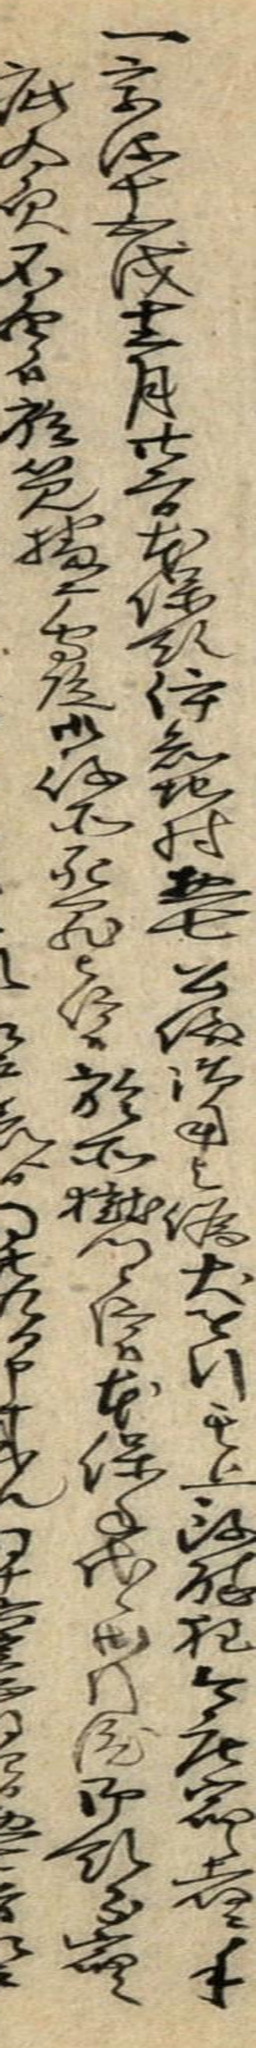疵為負不届に付於筧播磨守殿御役所死罪被仰付於所獄門被仰付本保手代へ御引渡御領分宿々
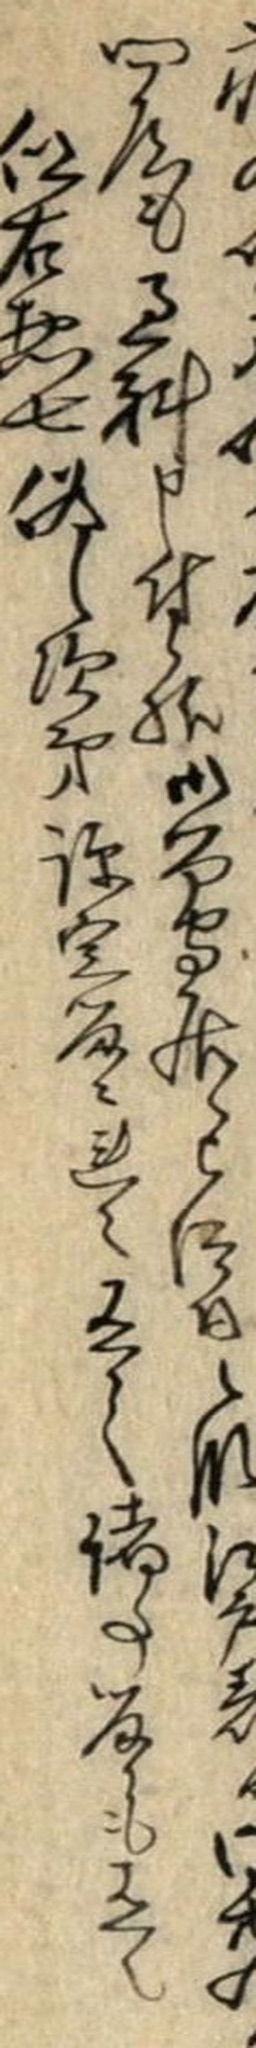但右惣七偽之次第評定留に連々有之諸事留にも有之

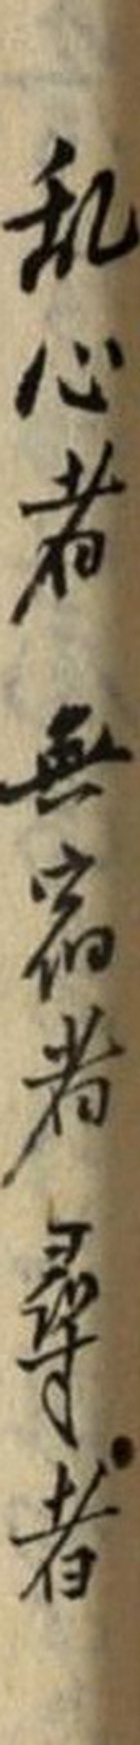乱心者無宿者尋者
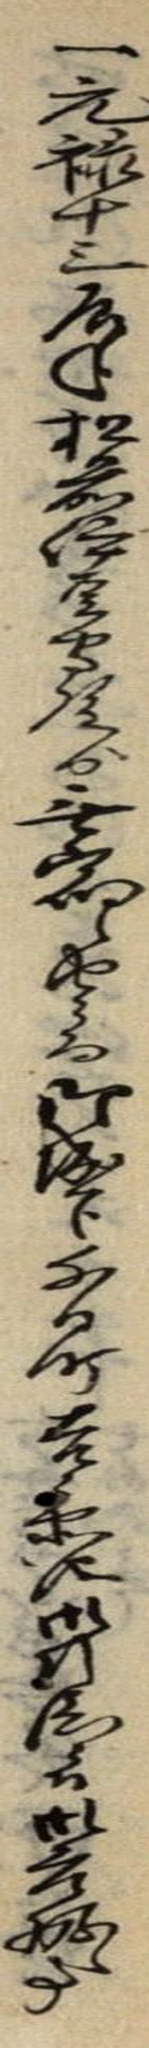一元禄十三辰年松前伊豆守殿ゟ無宿之由にて御城下千日町吉兵衛儀御引渡に付御取扱候事
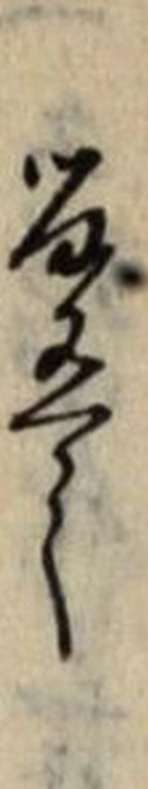留有之
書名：御停止異変死失
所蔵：福井県文書館 Fukui Prefectural Archives
